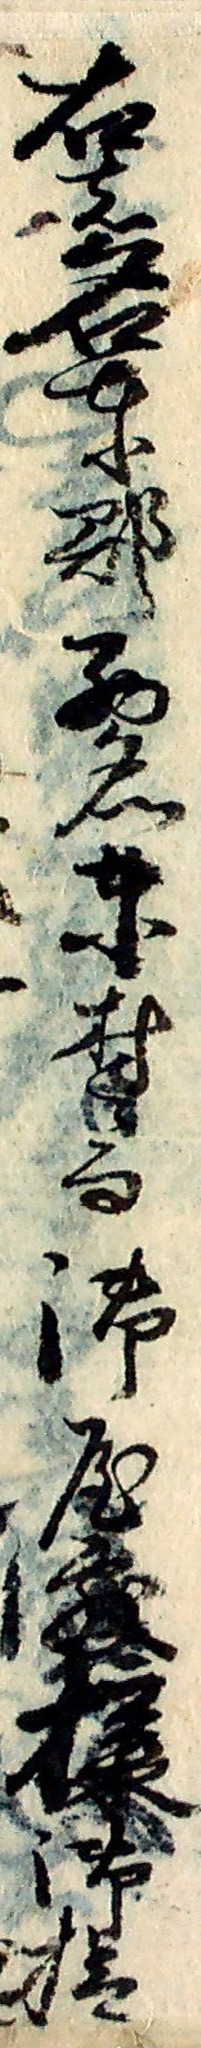右は名東郡西名東村にて御屋敷様御指届
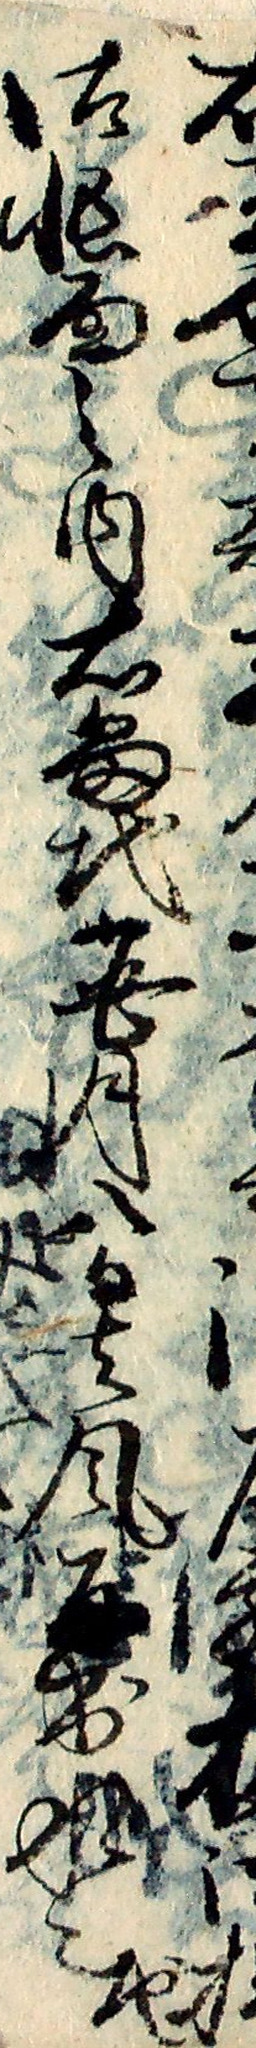御帳面之内右畠地当月八日は風雨出水也
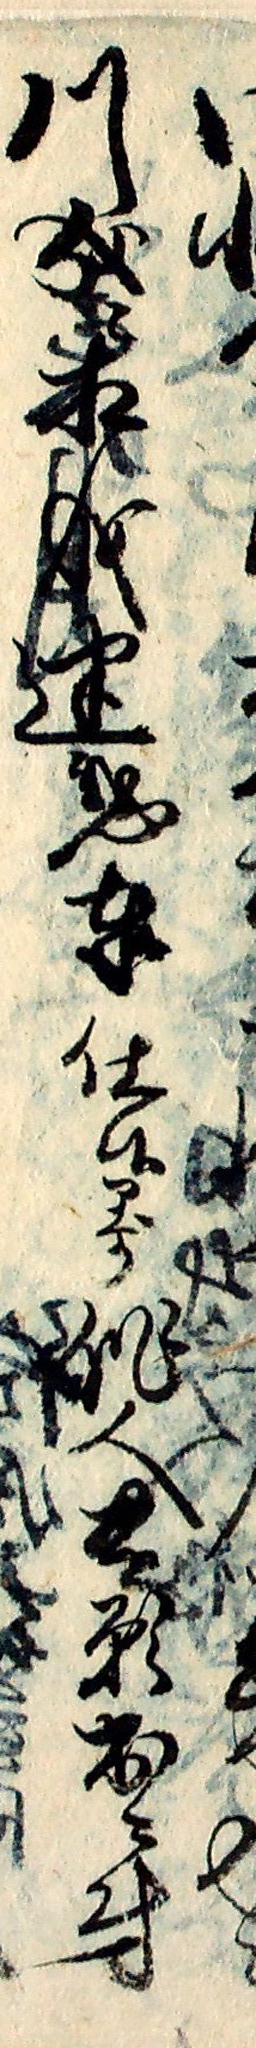川成に相成迷惑奉仕候寄作人共願出に付
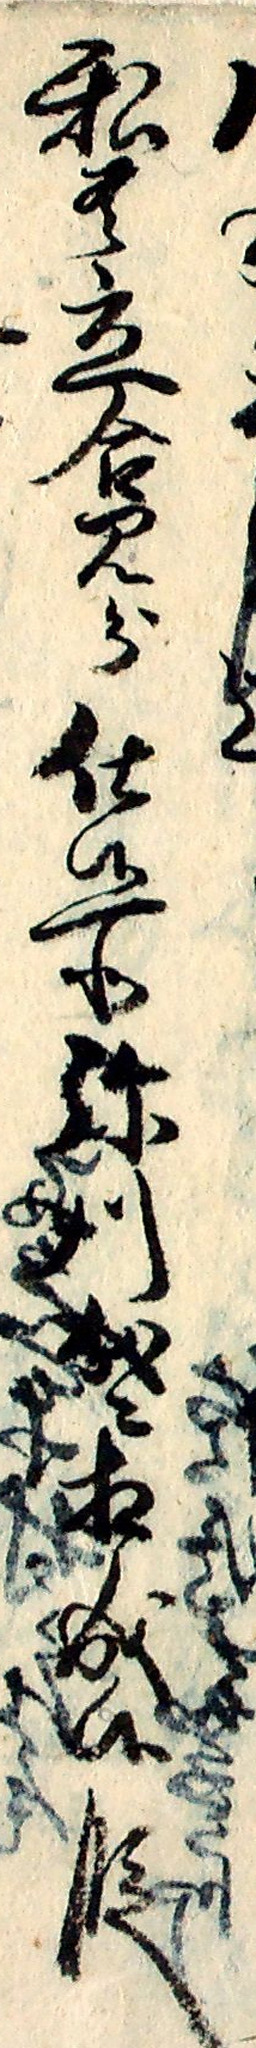私共立合見分仕候所弥川成に相成候段
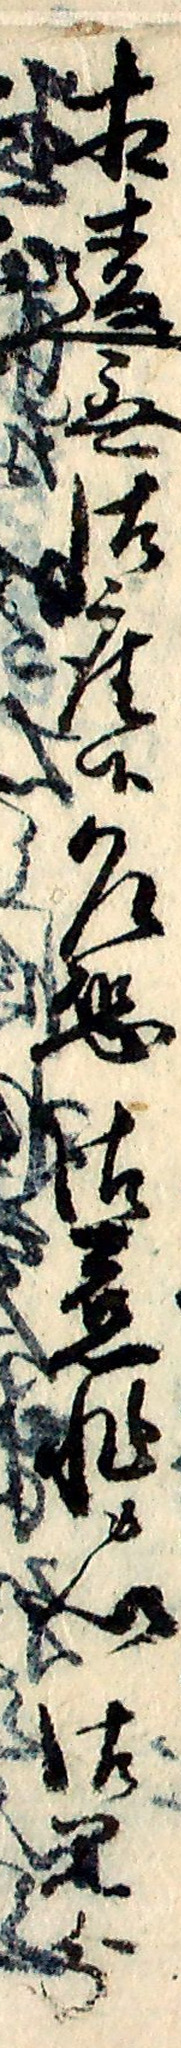相違無御座候乍恐御慈悲を以御見分
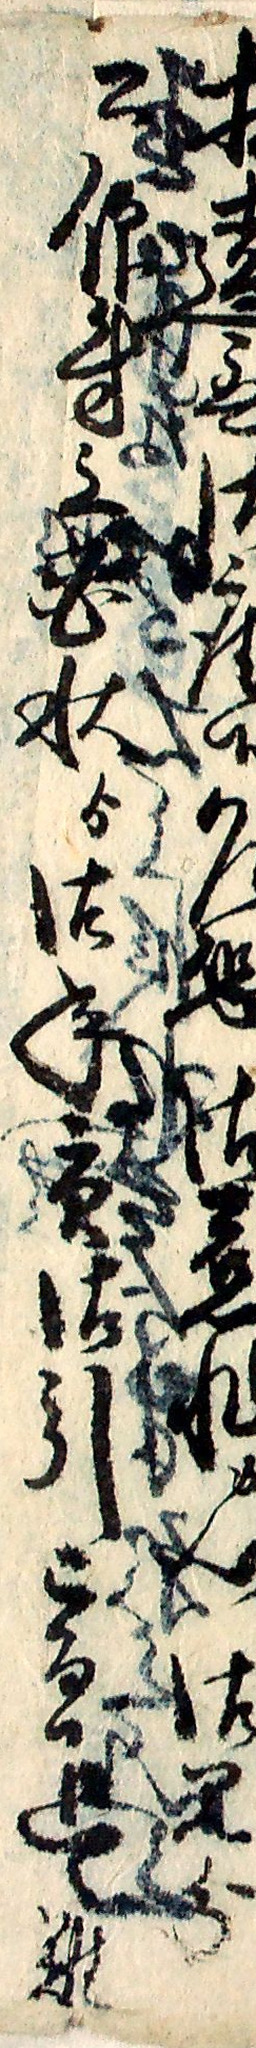被仰付上当秋ゟ御年貢御引被為下候はゝ難

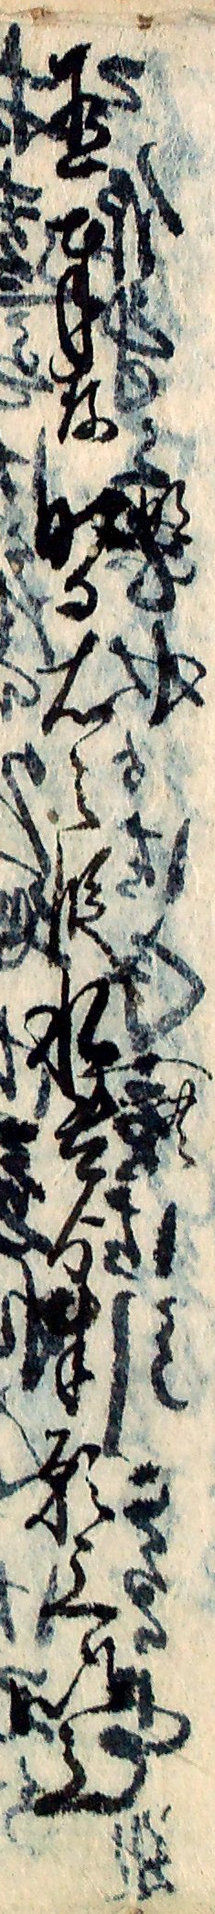有奉存仍て右之段私共ゟ奉願上候以上
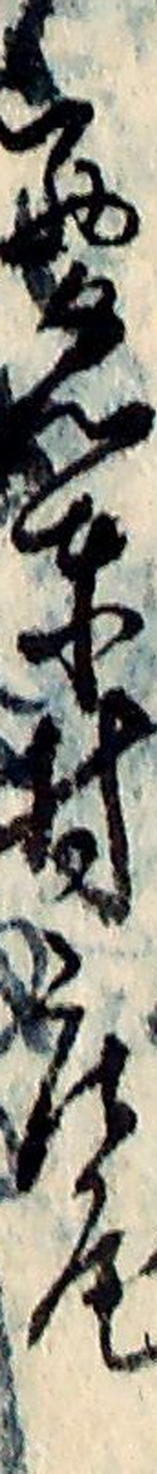西名東村庄屋
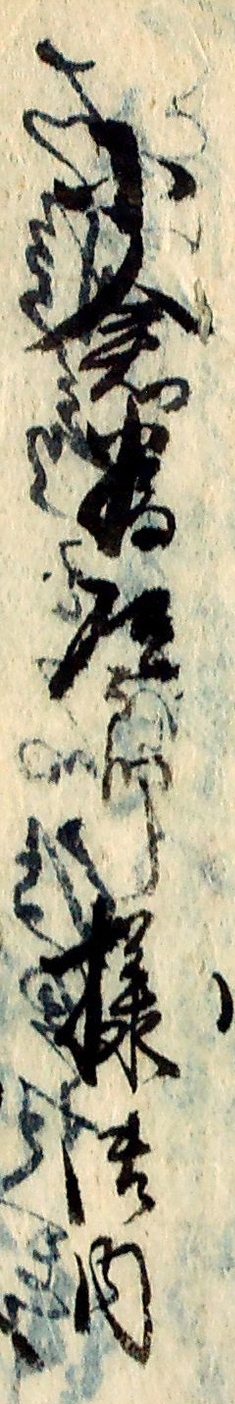小倉為次郎様御内
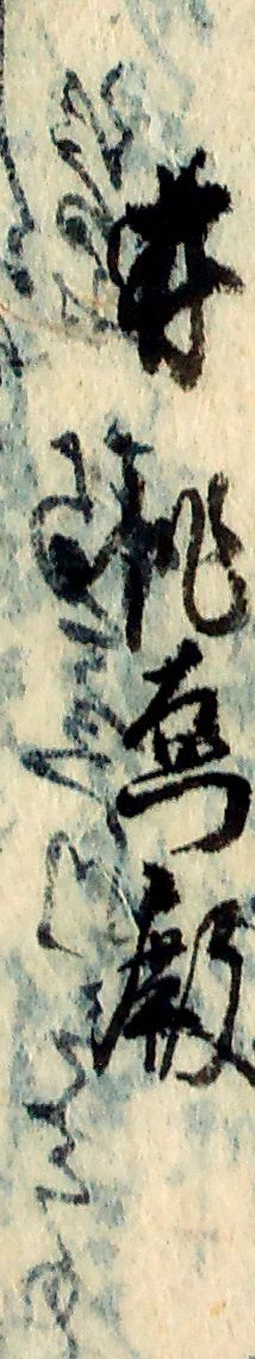井桃右衛門殿
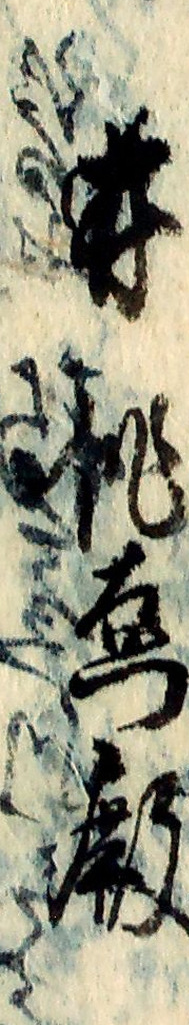井桃右衛門殿

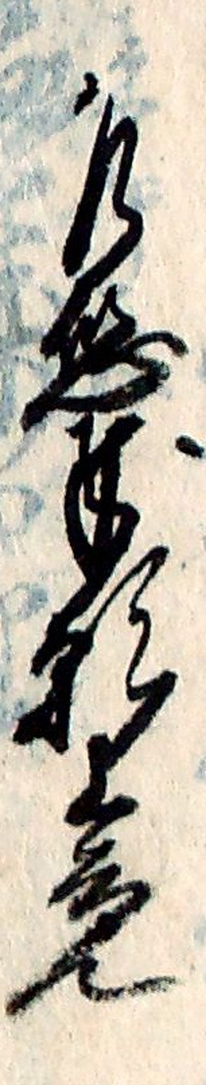乍恐奉願上覚
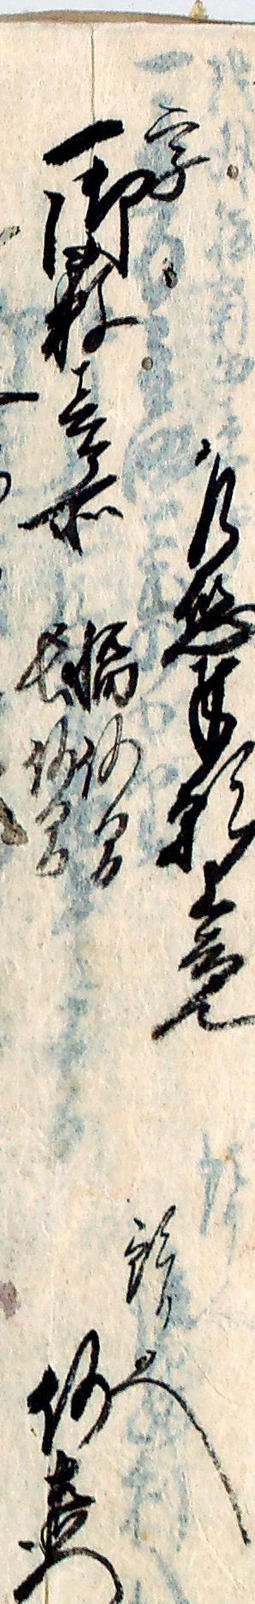一御藪壱ヶ所幅何間預り人
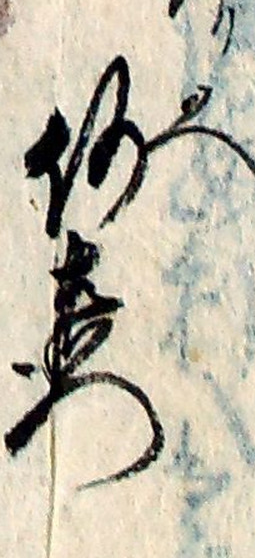何右衛門
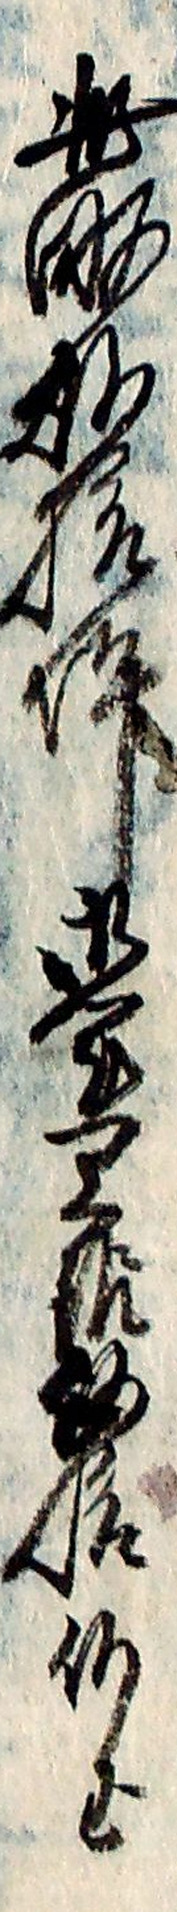此畝何拾坪御運上銀何倍何匁
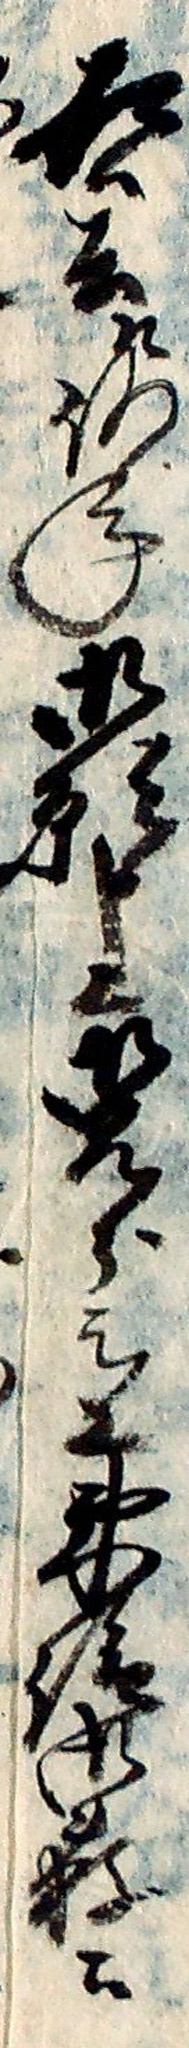右は去る何年御願申上御見分之上束請御藪被
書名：諸御願書控(後藤氏壱番）
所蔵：鳴門教育大学 Naruto University of Education
